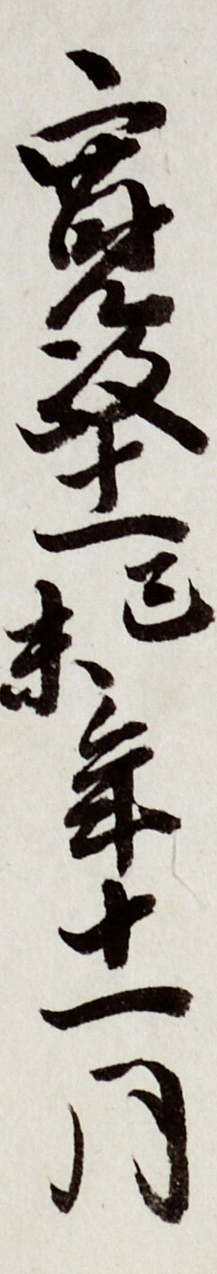寛政十一己未十一月
